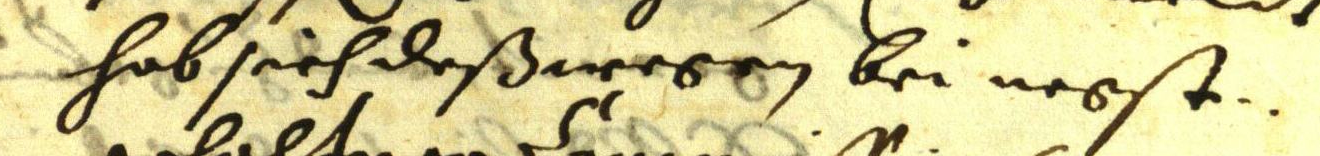Hab sich deßwegen bei negst¬
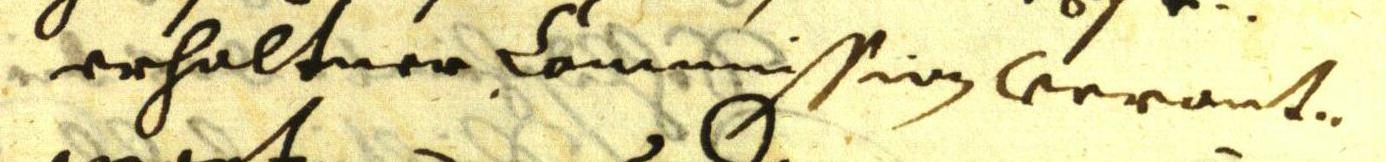erhaltner Commission verant¬
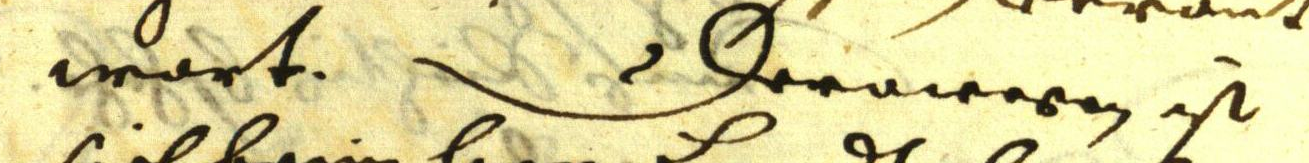wort. Derowegen ist
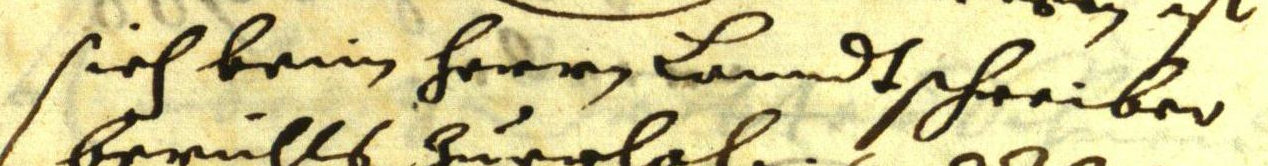sich beim herrn Lanndtschreiber
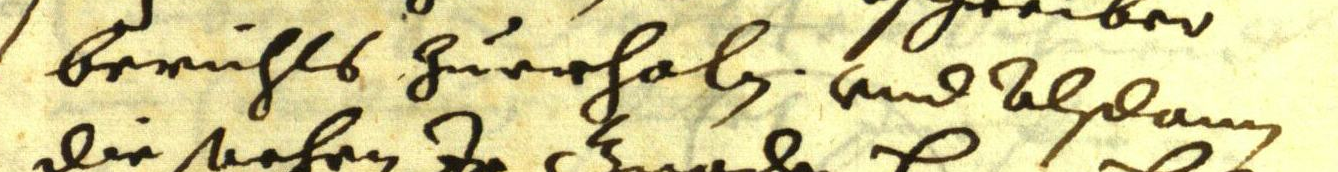berichts Zūerholn. vnd Alsdann
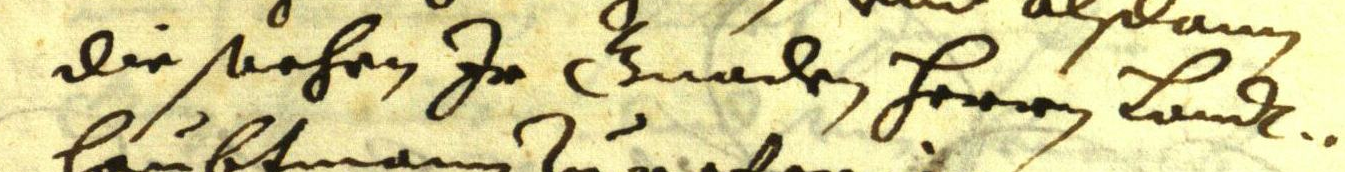die sachen Ir Gnaden herrn Landt¬
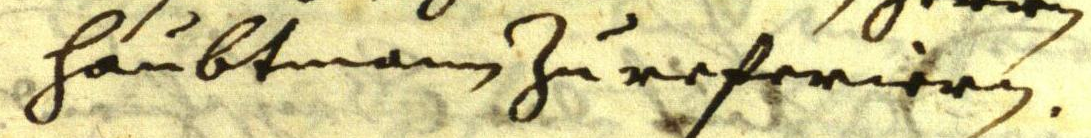haūbtmann Zū referiern.
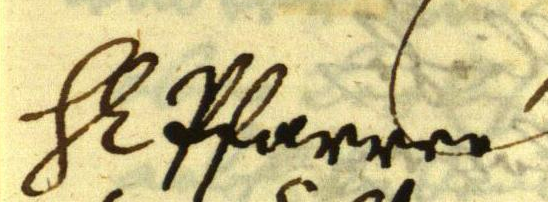H Pfarrer
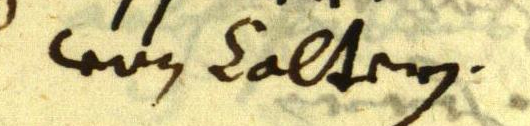von Caltern.
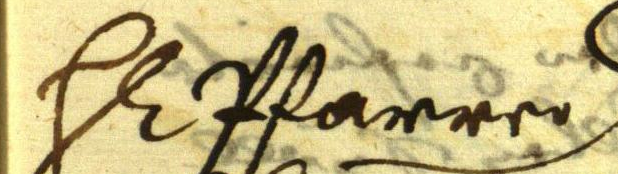H Pfarrer
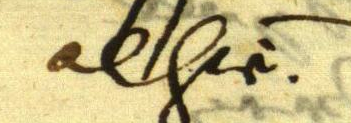alhie.
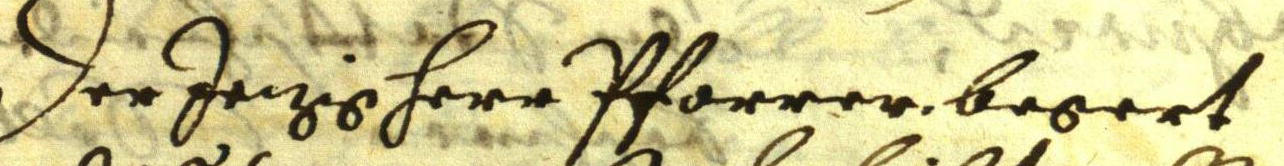Der Jetzig herr Pfarrer. begert
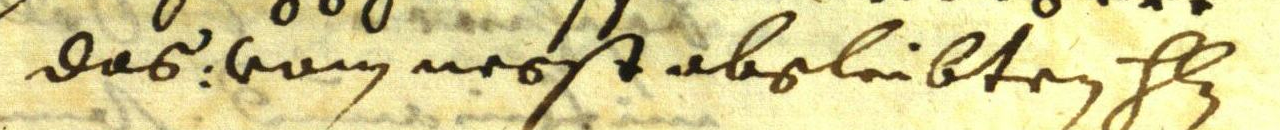Das: vom negst abgleibten hln
